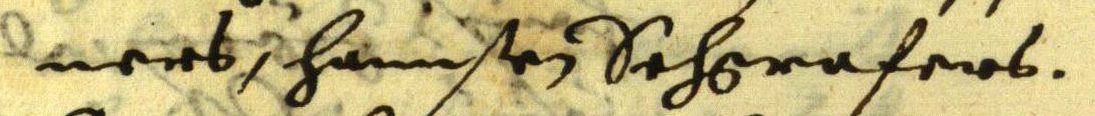ners, hannsen Schgrafers.
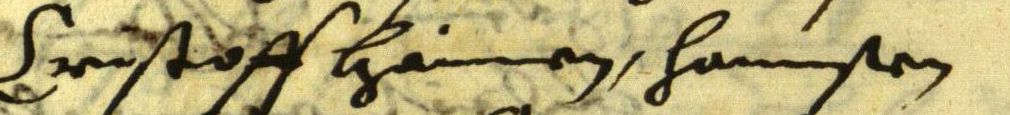Cristoff Haimen, hannsen
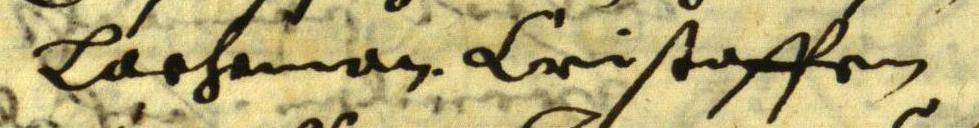Locheman. Cristoffen
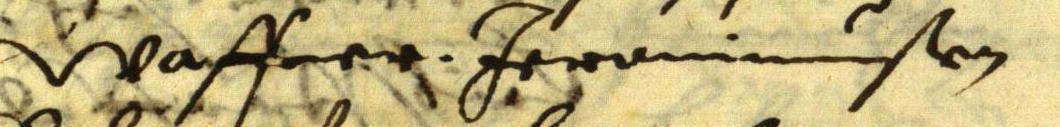Waffner. Jernonimūsen
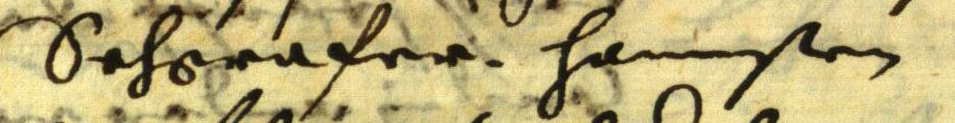Schgrafer. hannsen
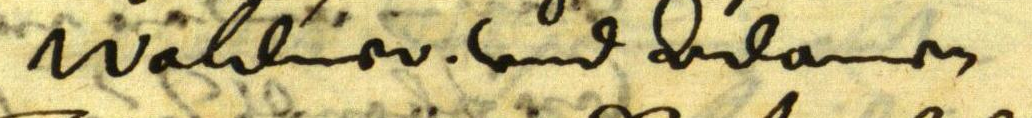Waldner. vnd Adamen
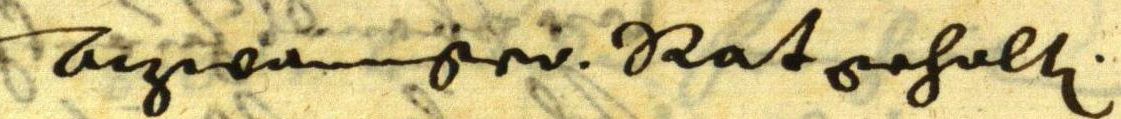Azwannger. Rat gehalt.
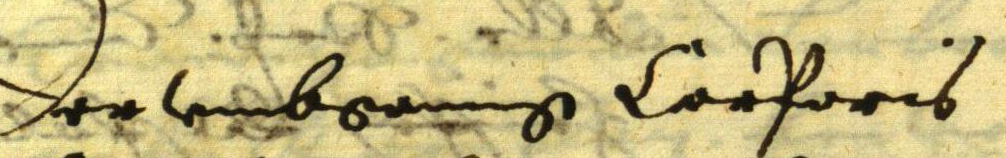Der vmbganng CorPoris
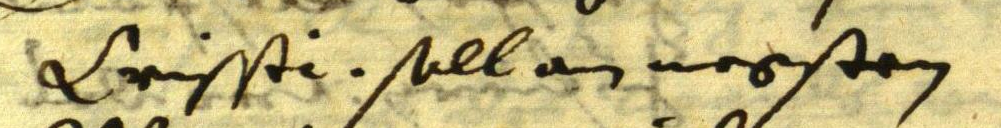Crissti. soll an negsten
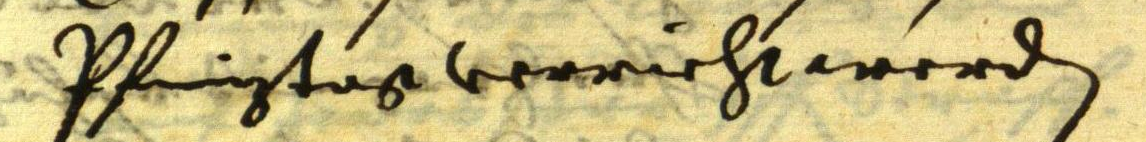Pfinztag verricht werd.
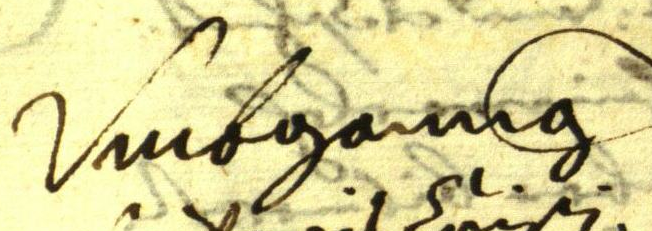Umbganng
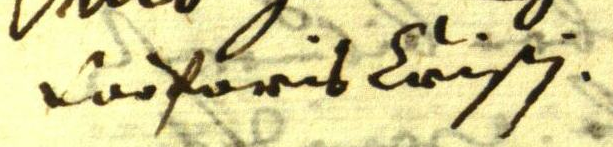CorPoris Cristj.
